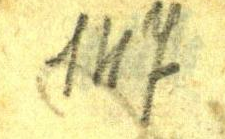147
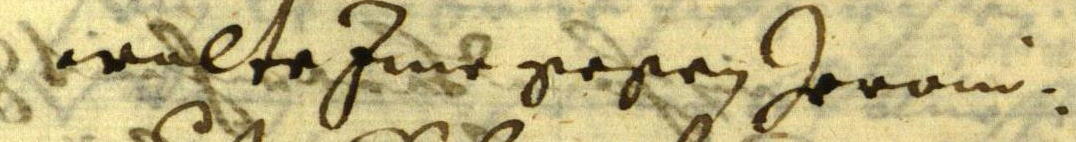wolte Ime gegen Jeroni¬
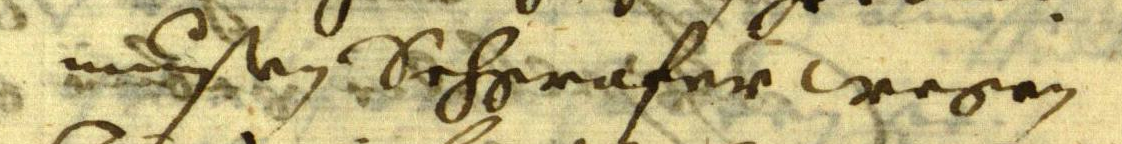mūsen Schgrafer wegen
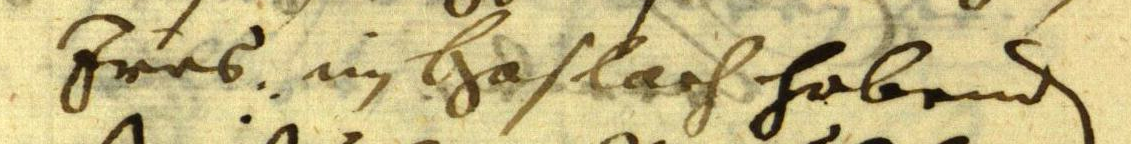Ires in Haslach habend
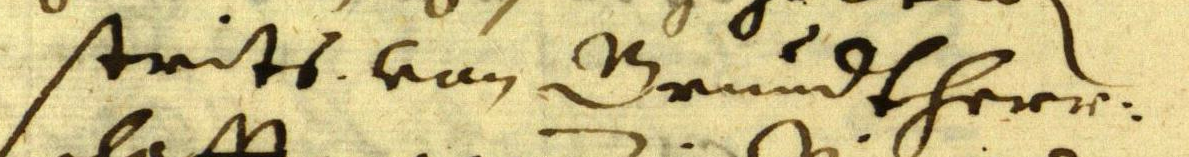streits. von Grūndtherr¬
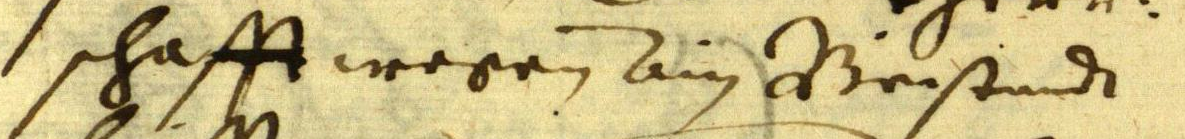schafft wegen Ain Beistandt
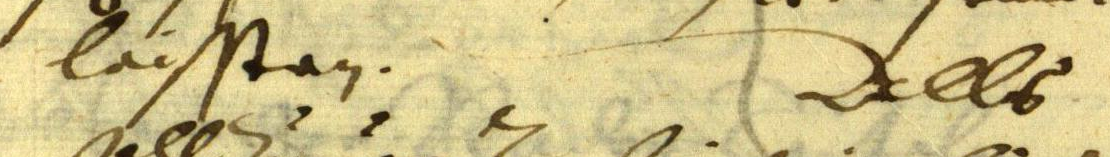laissten. Alls
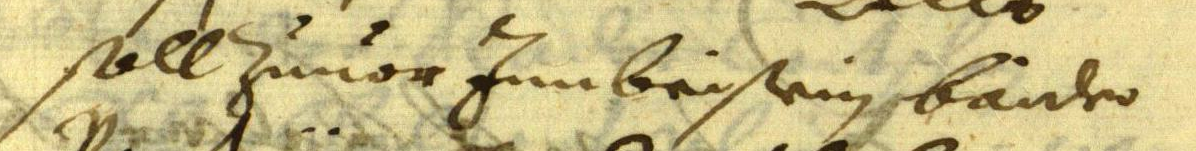soll Zūūor Inn beisein baider
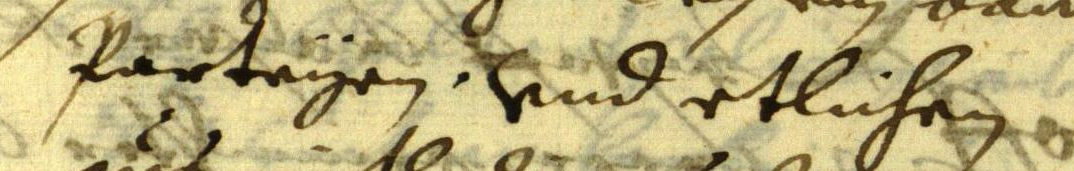Parteÿen. vnd etlichen
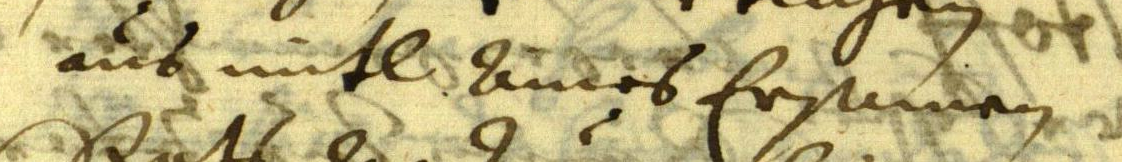aūs mitl Aines Ersamen
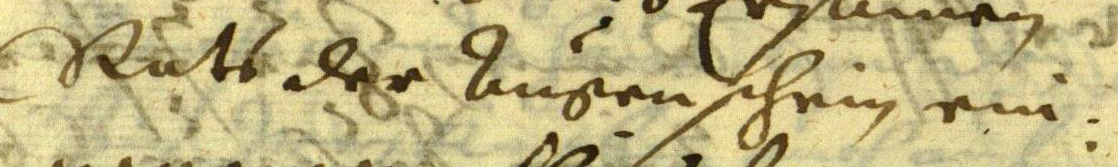Rats der Aūgenschein ein¬
